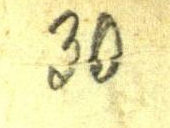30
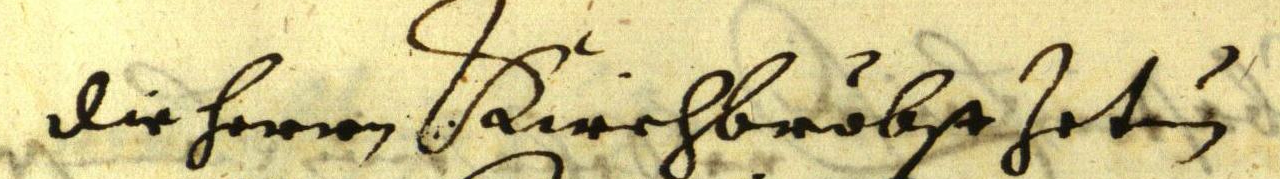die herrn Kirchbrobst Zetūn
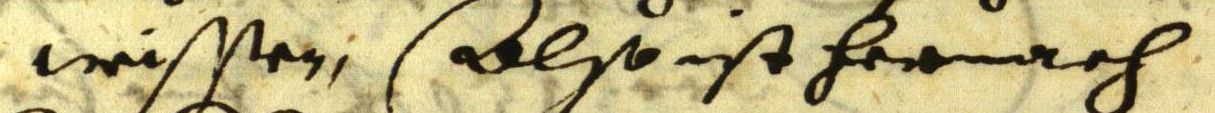wissen, Also ist hernach
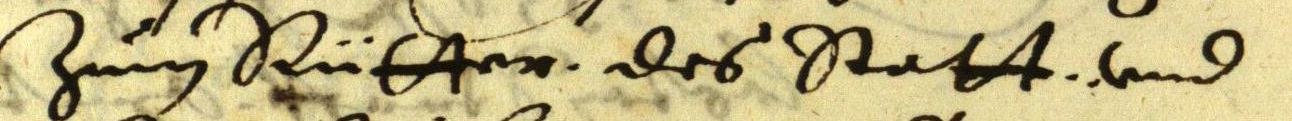Zūm Rütter. des Statt- vnd
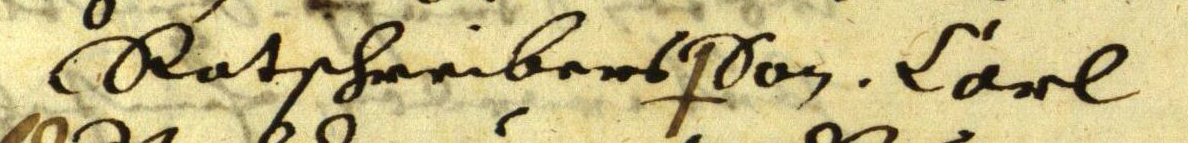Ratschreibers + Son. Carl
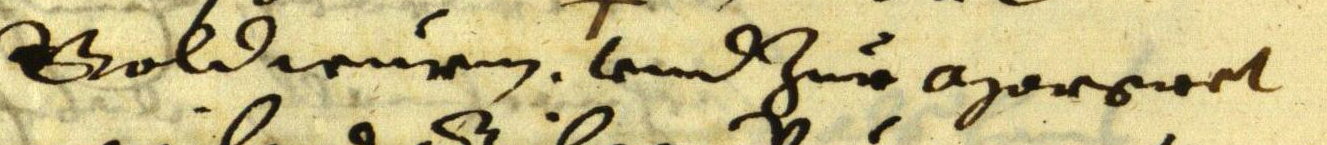Goldwūrm. vnd Zūr Morgret
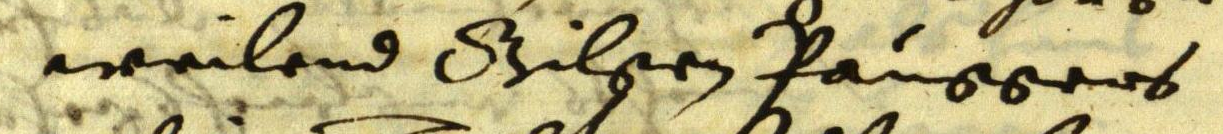weilend Gilgen Paūggers
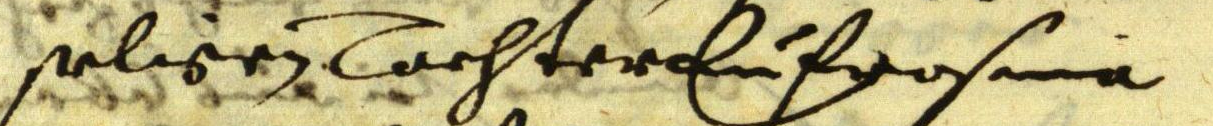Seligen Tochter Eūfrasina
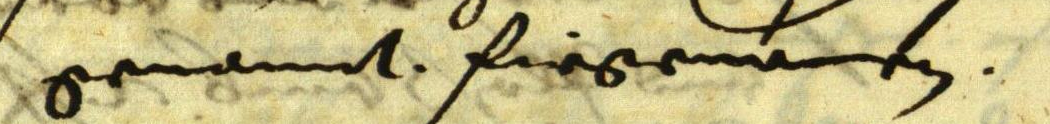genannt. firgenomen.
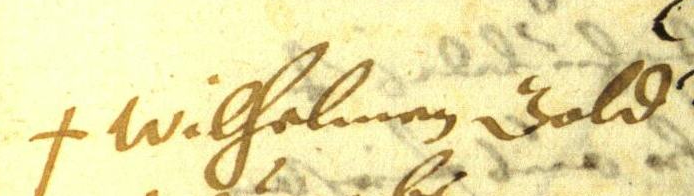+ Wilhelmen Gold¬
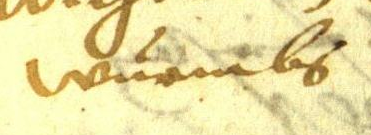wūrmbs
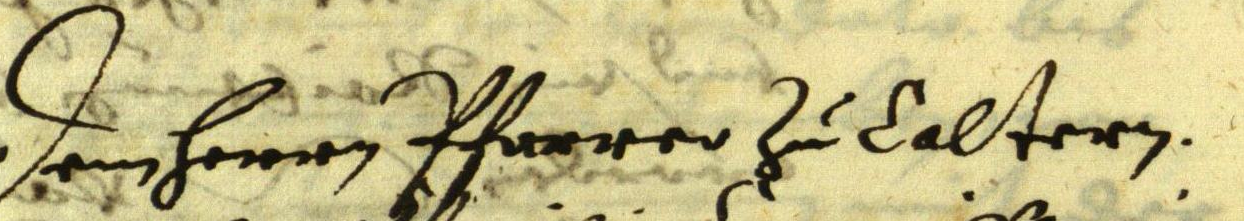Dem herrn Pfarrer Zū Caltern.
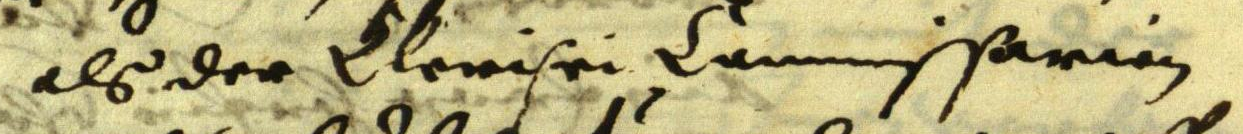als der Clerisei Commissarien
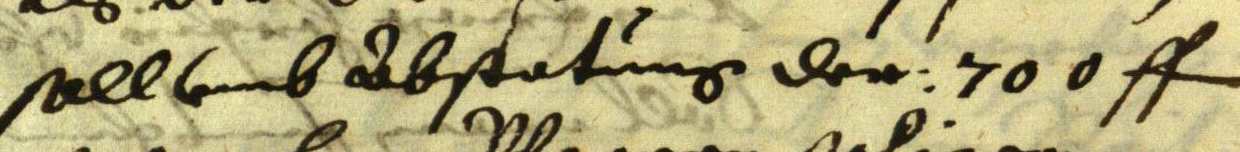soll umb Abstatūng der: 700 fl
